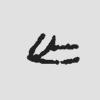亡
